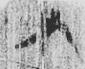又（有）
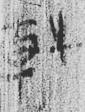軒
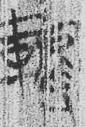○（冕）
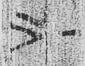之
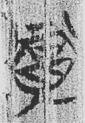賞
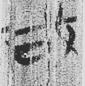或
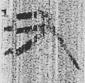又（有）
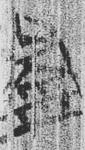釜（斧）
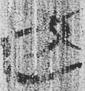戉（鉞）
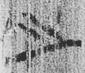之
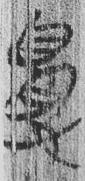○（威）
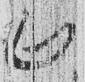㠯（以）
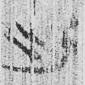此
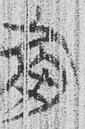前
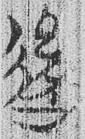○（後）
